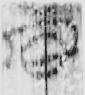○（期）
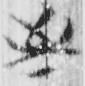至
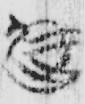○（屈）
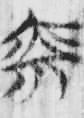○（夕）
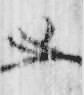之
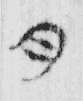月
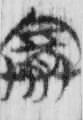賽
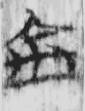金
